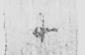十
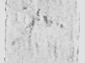六
